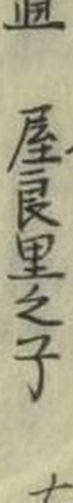先屋良里之子
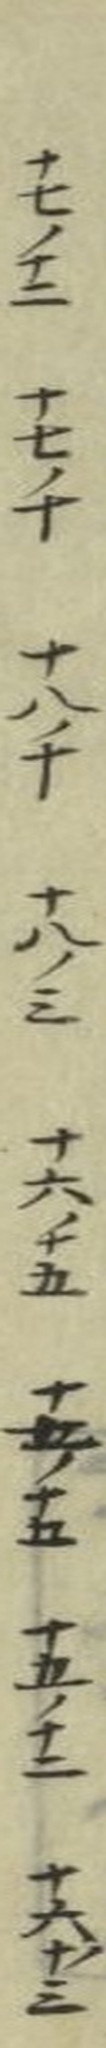十七ノ十二十七ノ十十八ノ十十八ノ三十六ノ十五十五ノ十五十五ノ十二十六ノ十三
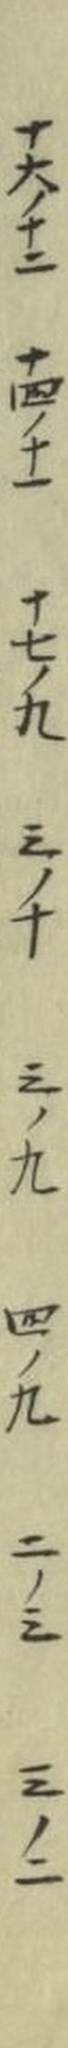十六ノ十二十四ノ十一十七ノ九三ノ十三ノ九四ノ九二ノ三三ノニ
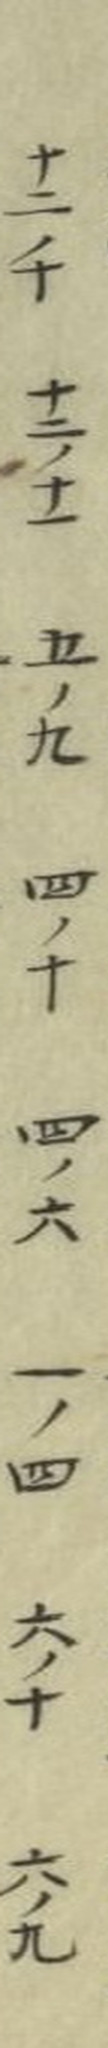十二ノ十十二ノ十一五ノ九四ノ十四ノ六一ノ四六ノ十六ノ九
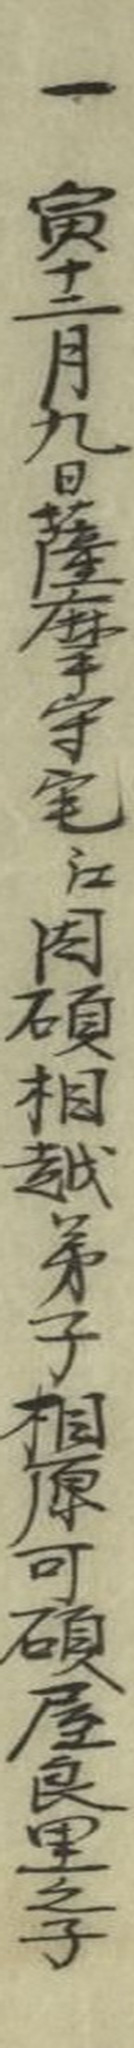一寅十二月九日薩摩守宅え因硯相越弟子相原可硯屋良里之子
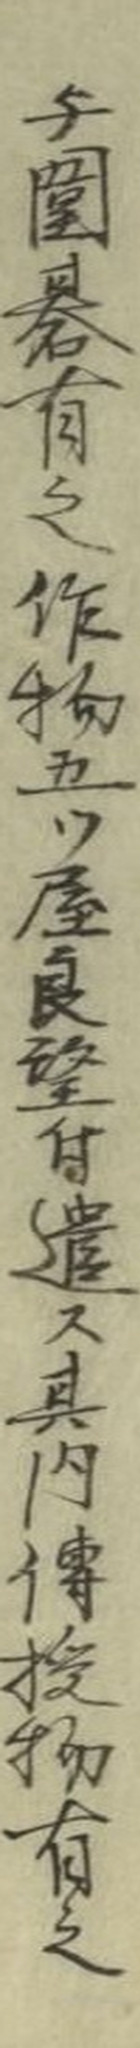と囲碁有之作物五ツ屋良望付遣す其内伝授物有之
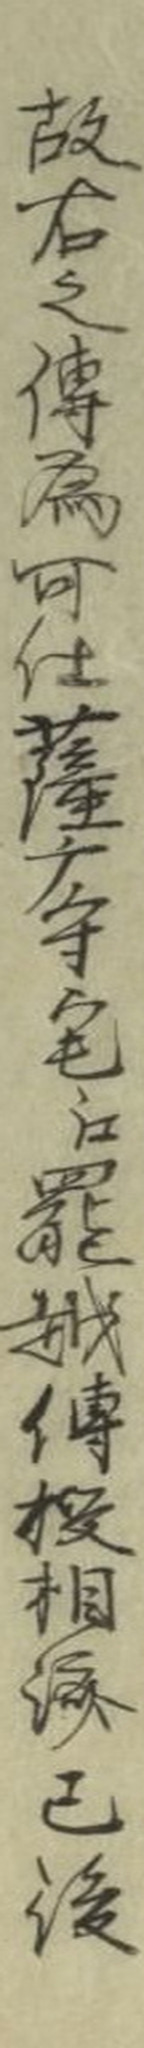故右之伝為可仕事薩摩守宅え罷越授相済已後
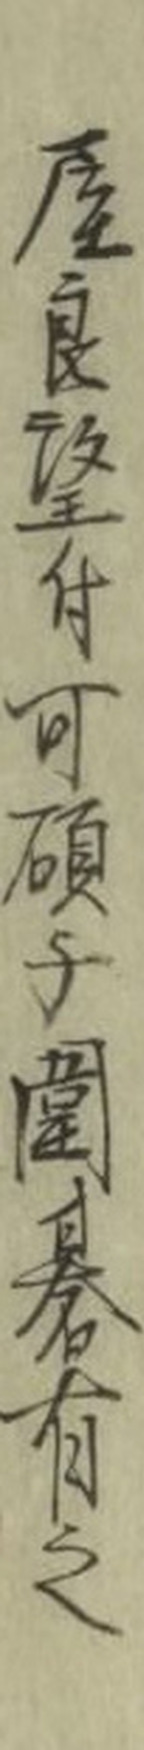屋良望付可硯と囲碁有之
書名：宝永七庚寅年琉球国来聘使日記
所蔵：University of the Ryukyus Library
